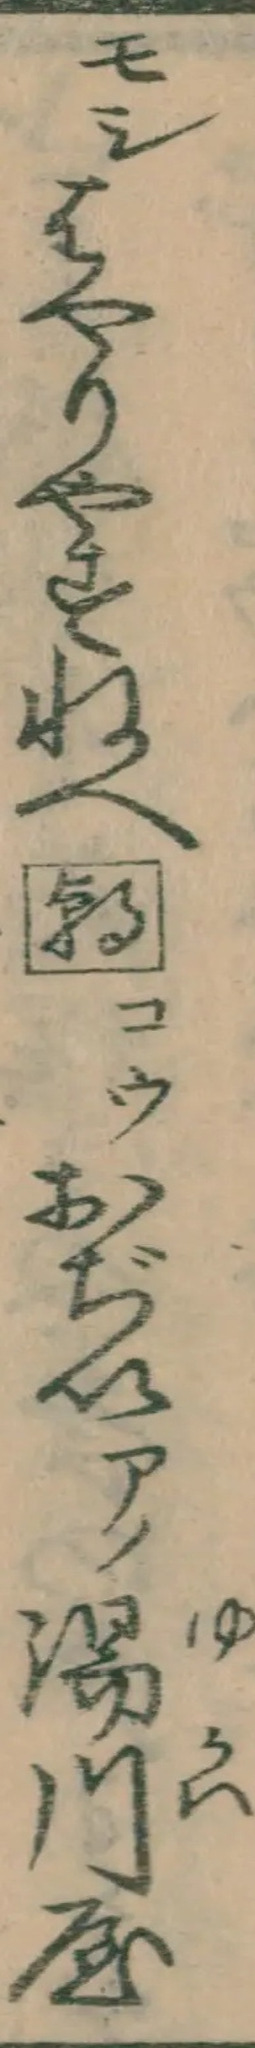モシはやりやすねへ〈朝〉コウおぢいアノ湯川屋
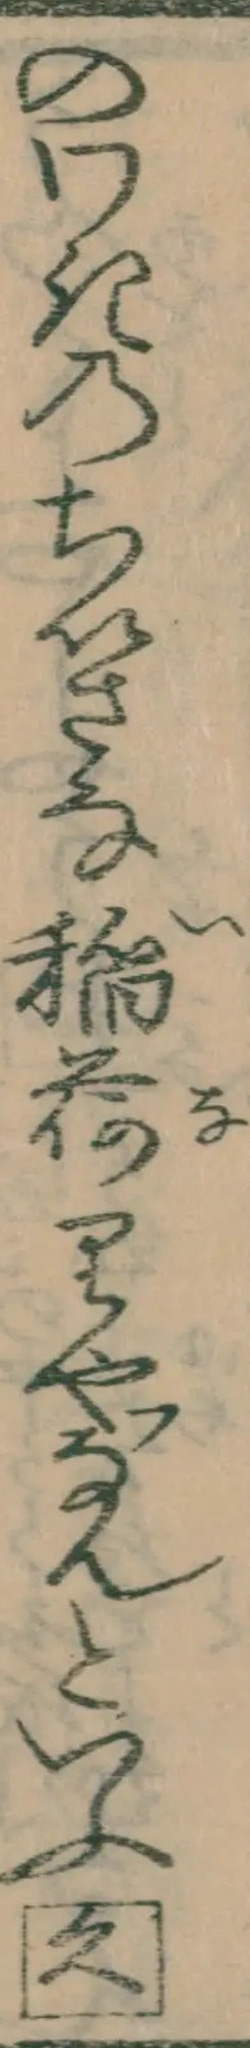のわきのちいさな稲荷りや〈久〉
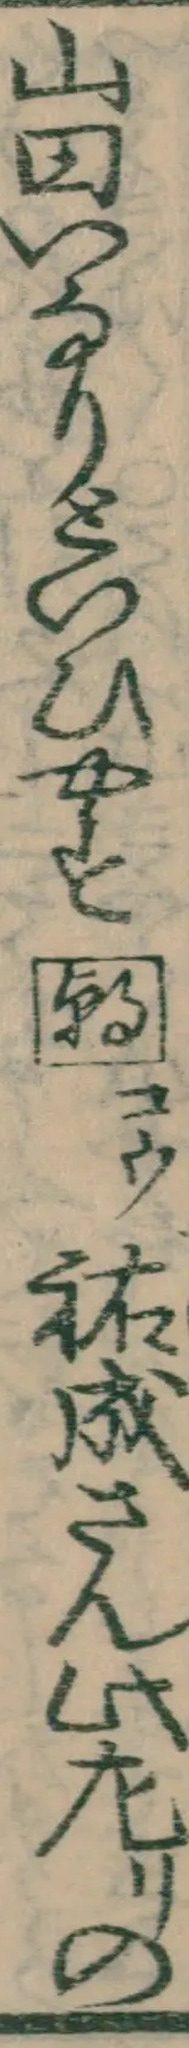山田いなりといひやす〈朝〉コウ祐成さん此左りの
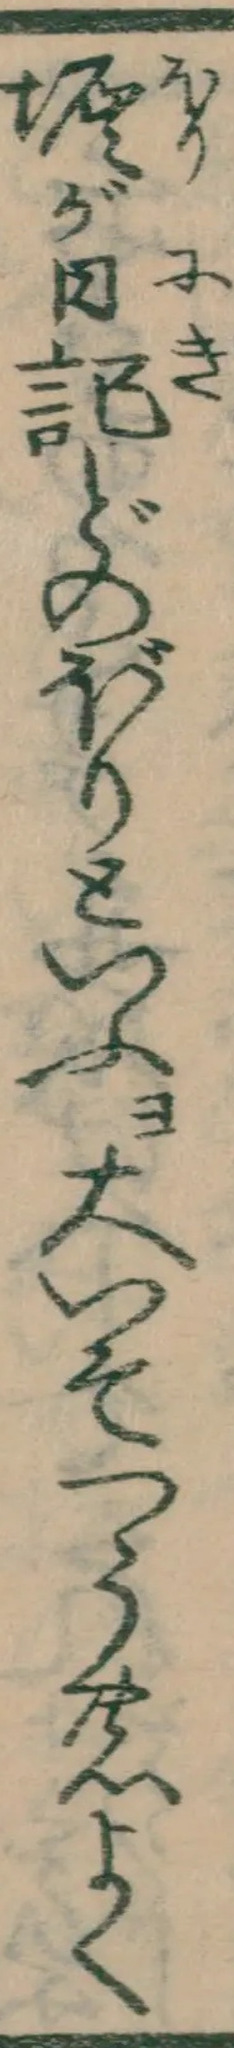堀が日記どのぼりといふヨ大いそつうのよく
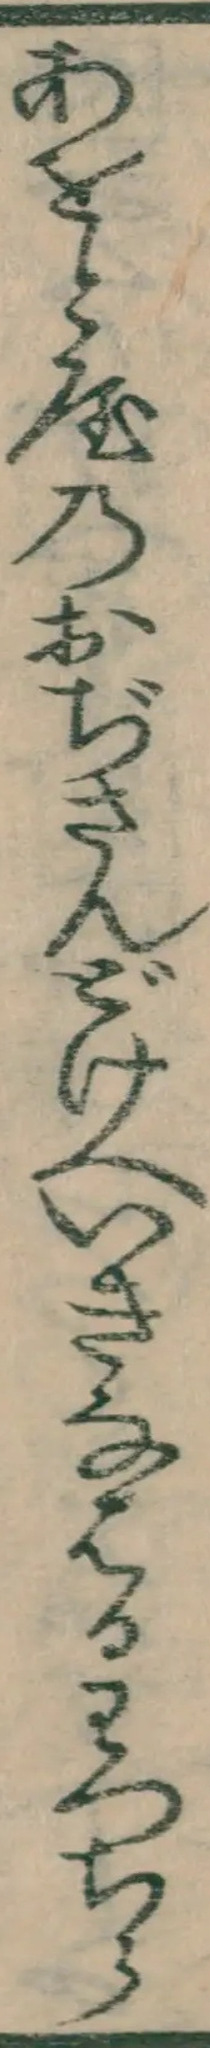あをと屋のおぢさんどけへいきなはるわつちら
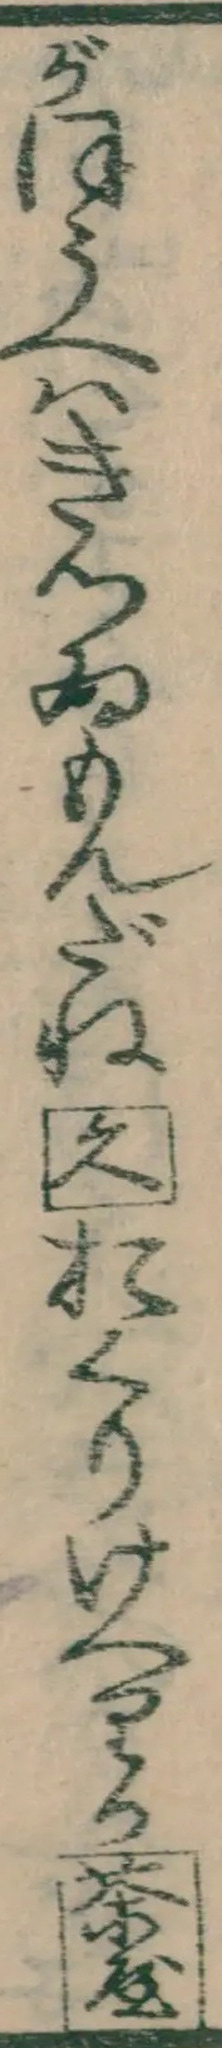がほうへはきつゐもんだね〈久〉おくりけへり〈茶屋

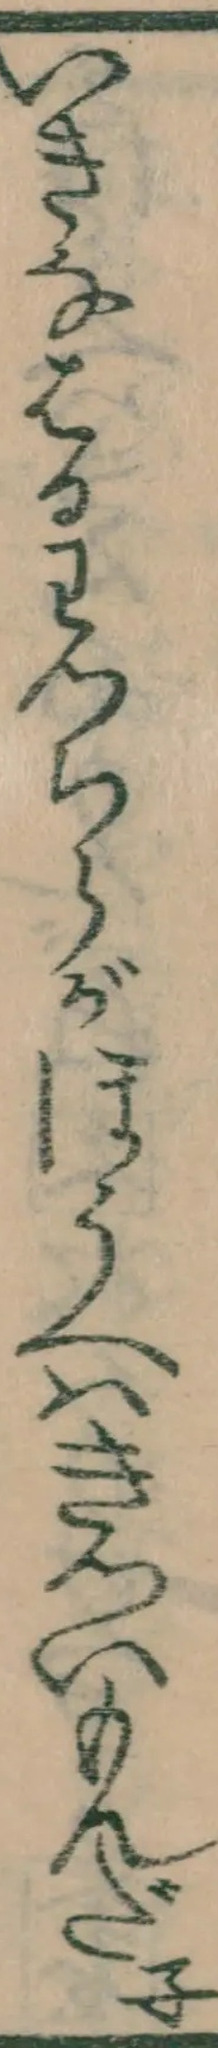いきなはるわつちらがほうへはきついもんだネ
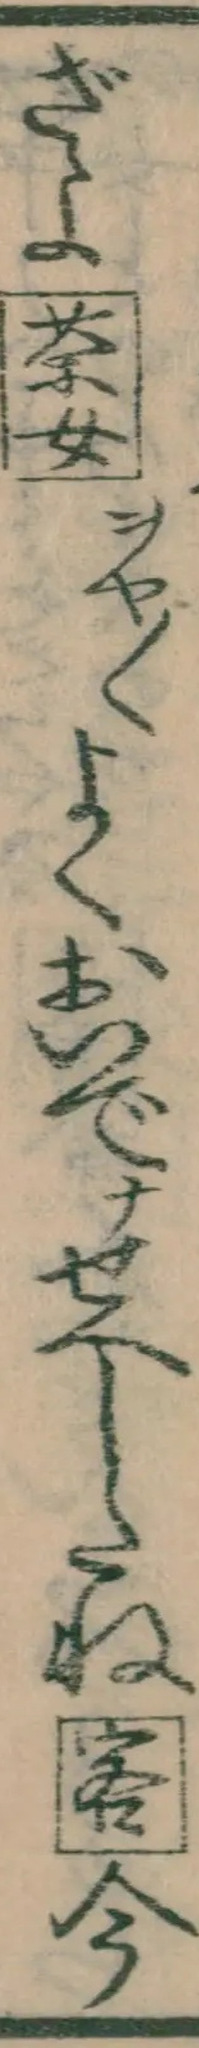ざよ〈茶女〉ヲヤ〳〵よくおいでナせへしたね〈客〉今
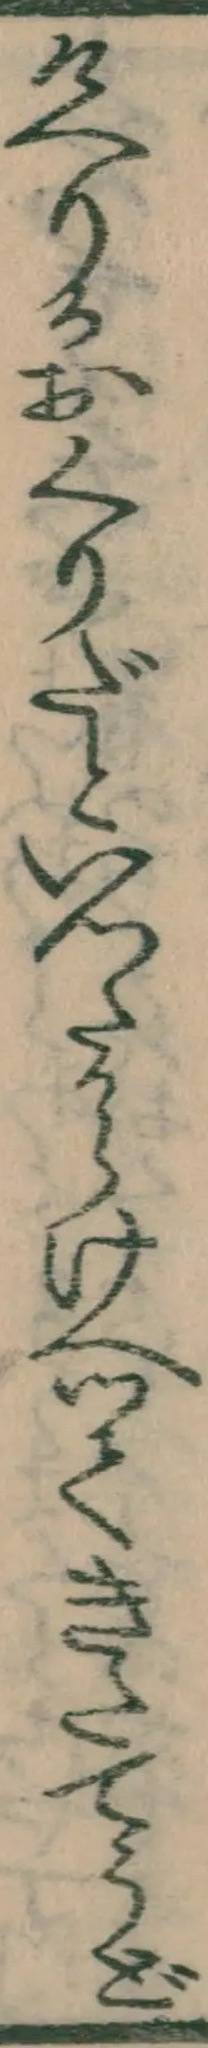けへりかおくりだといつたからけへつてきたてうど
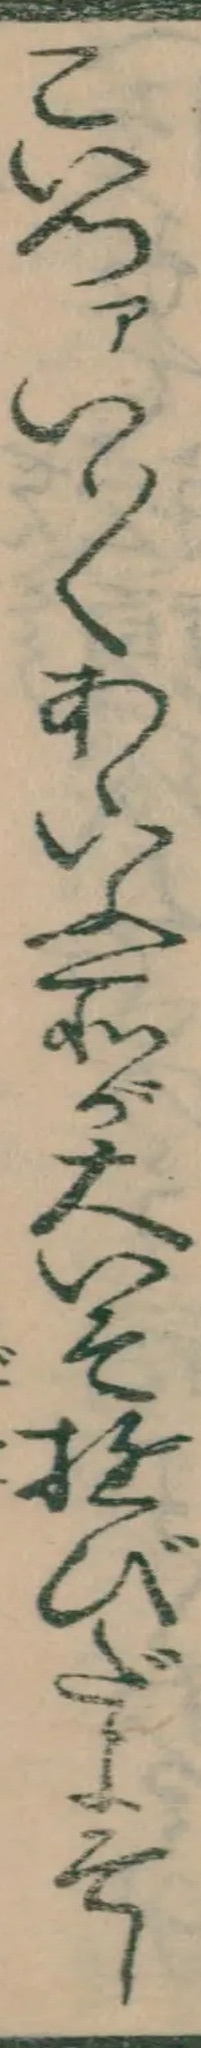こいつァいゝ〳〵あゝいふ所ゟ大いそ遊びだよそし
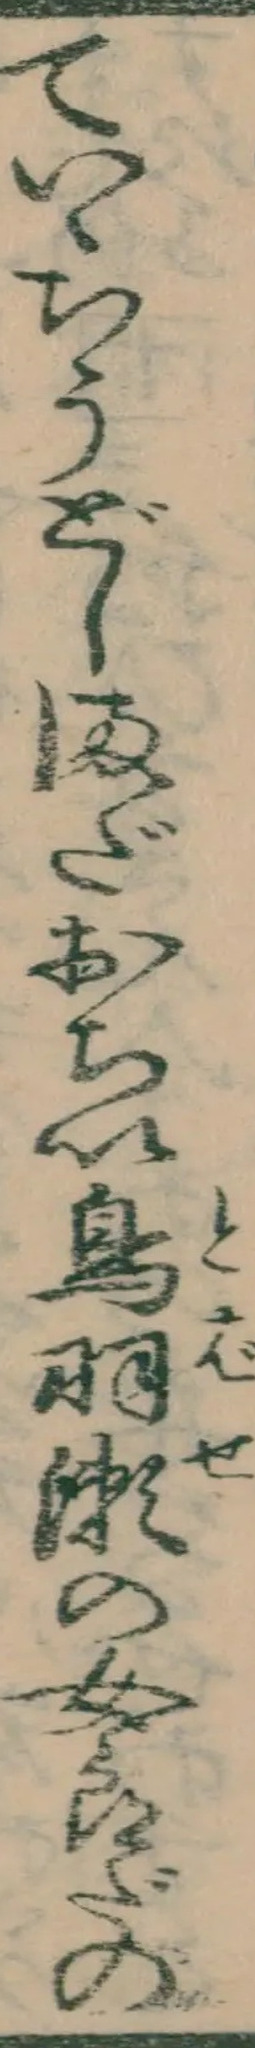ていゝちうどしまだおちい鳥羽瀬の女郎だの
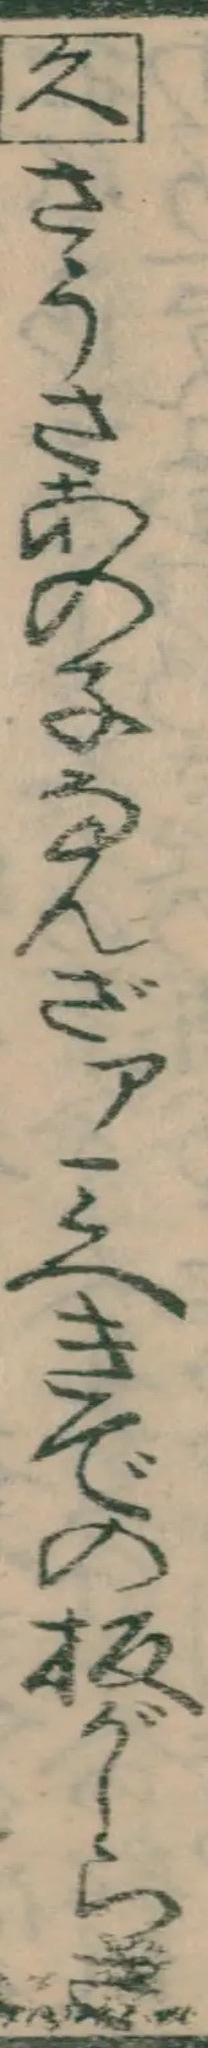〈久〉さうさあの子なんざアみへきでの板がしらさ
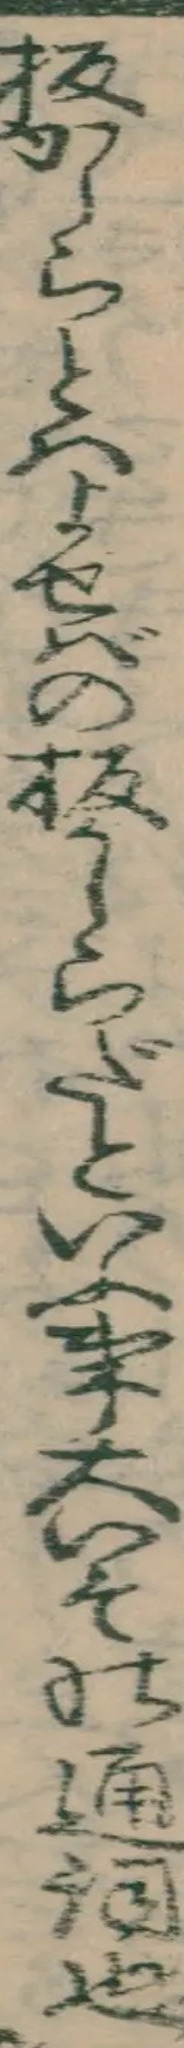板かしらとはよせばの板かしらだといふ事大いその通誦也
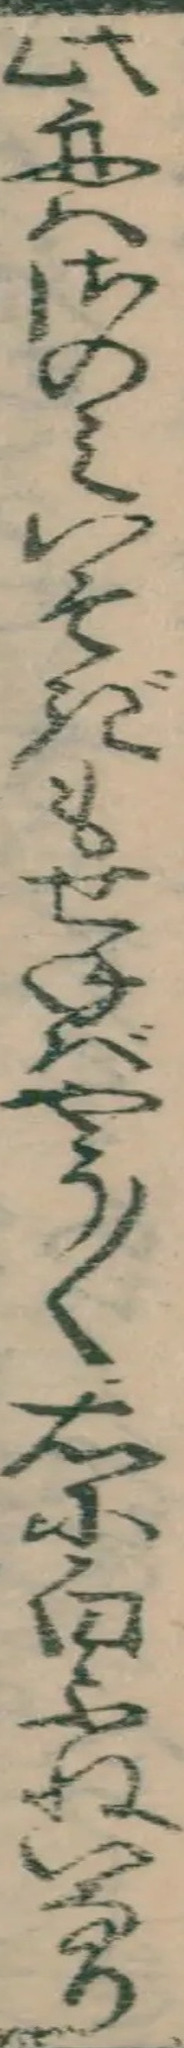此舟はさのみいそぎもせねばやう〳〵右に白ふねいなりて
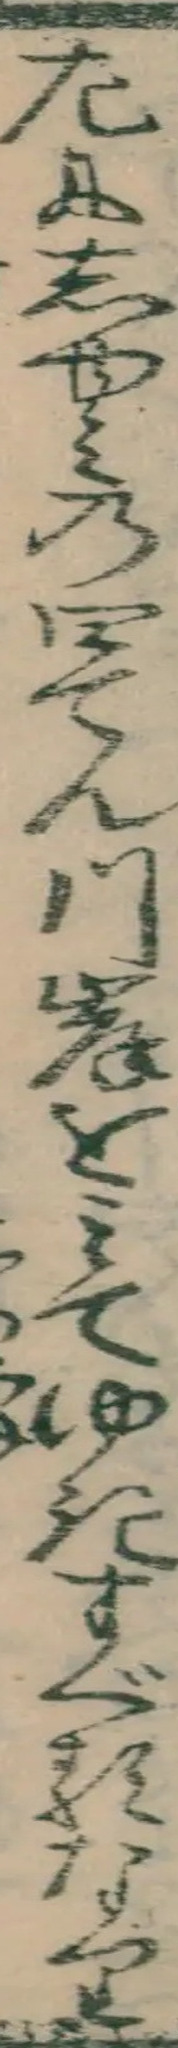左にしゆみの四てん川岸をみてゆきすぐるなり
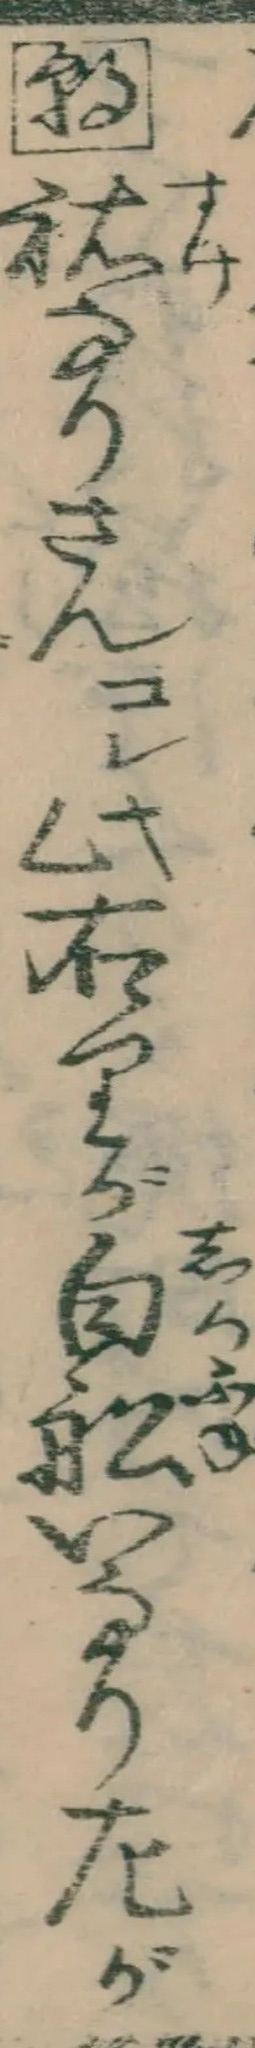〈朝〉祐なりさんコレ此右りが白船いなり左が
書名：教訓読本：大礒風俗仕懸文庫
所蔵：国立国会図書館 National Diet Library, JAPAN
